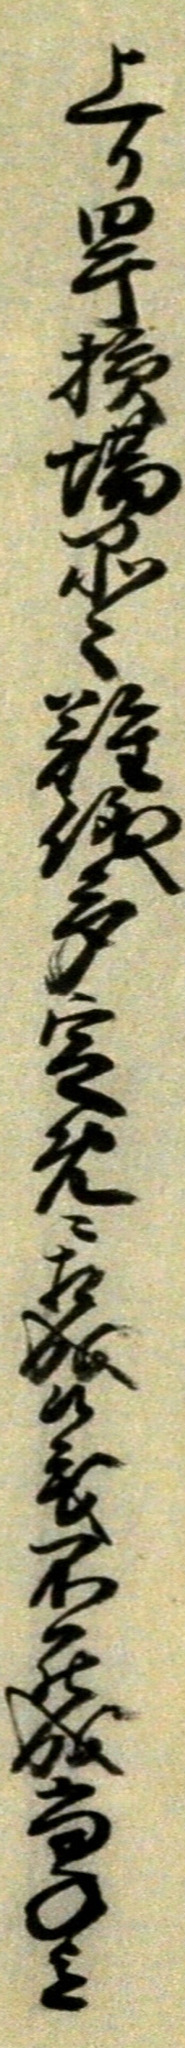上り旱損場品々難儀多定免ニ相成候義不罷成当年迄
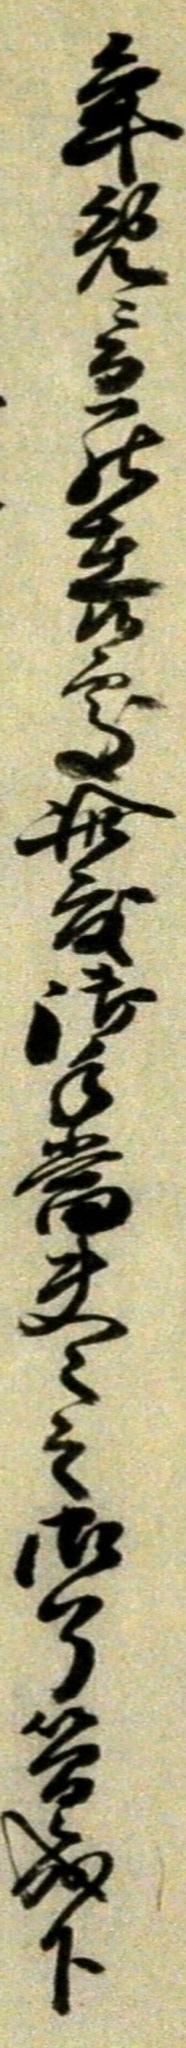年免ニ而罷在候處此度御手当夫々之御了簡被成下
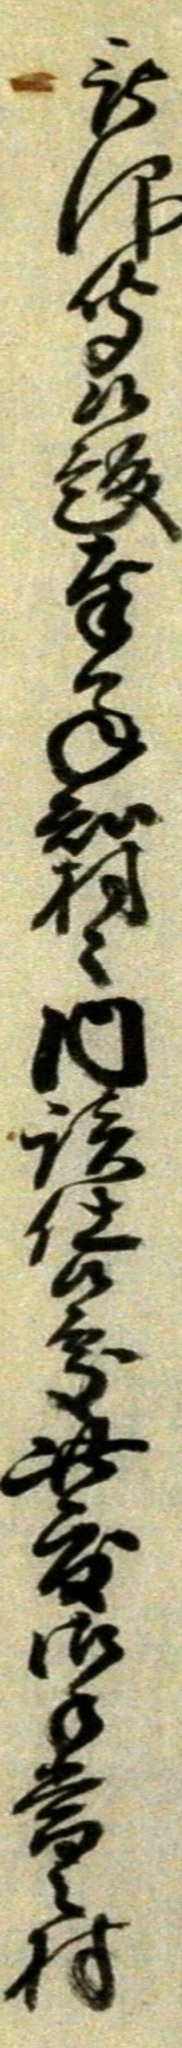被仰聞候趣奉承知村々内談仕候處此度御手当之村
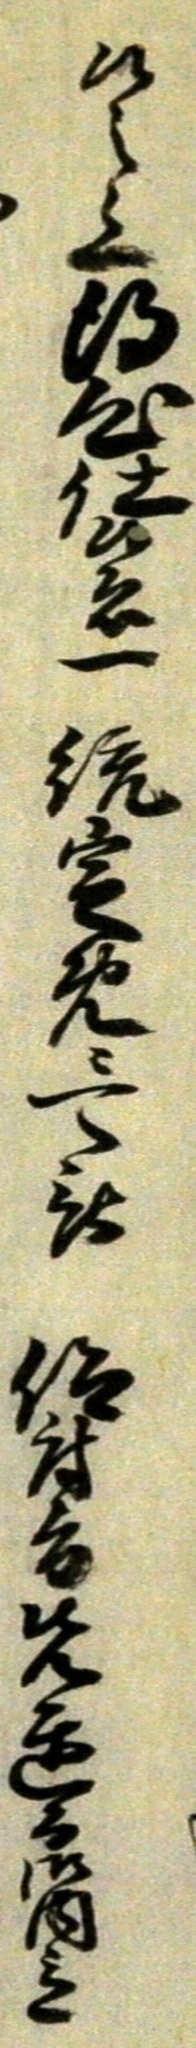候之上得心仕候者一統定免ニ可被仰付旨先達而御内意
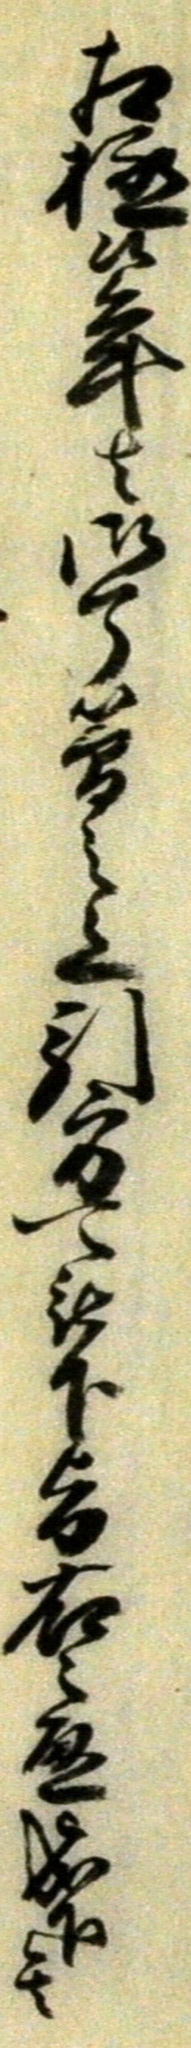相極候年者御了簡之上引方可被下旨右之通被成下候者
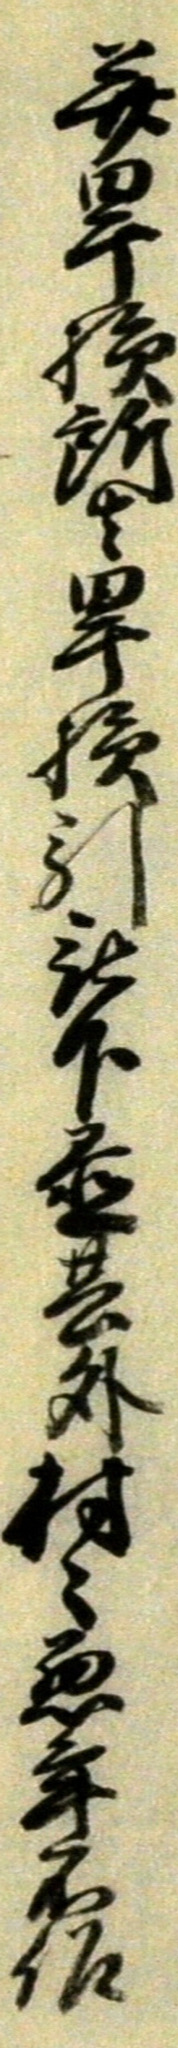幷旱損所者旱損引被下置其外村々悪年不作
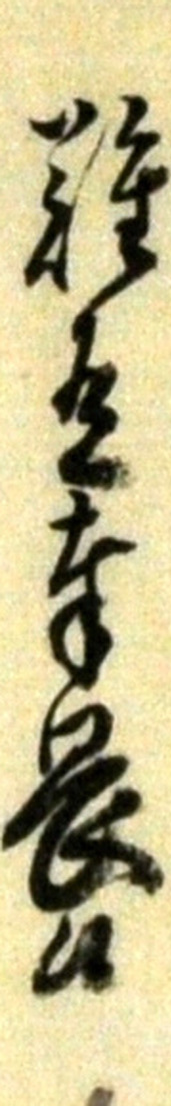難有奉畏候
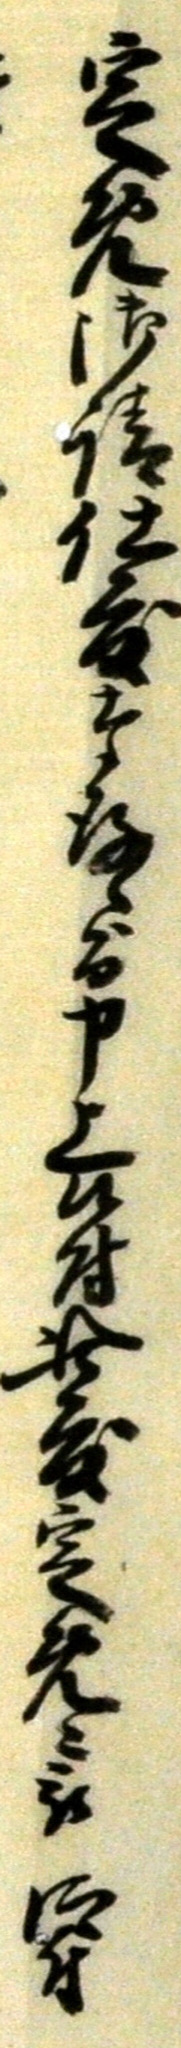定免御請仕度奉存候旨申上候付此度定免ニ被仰付
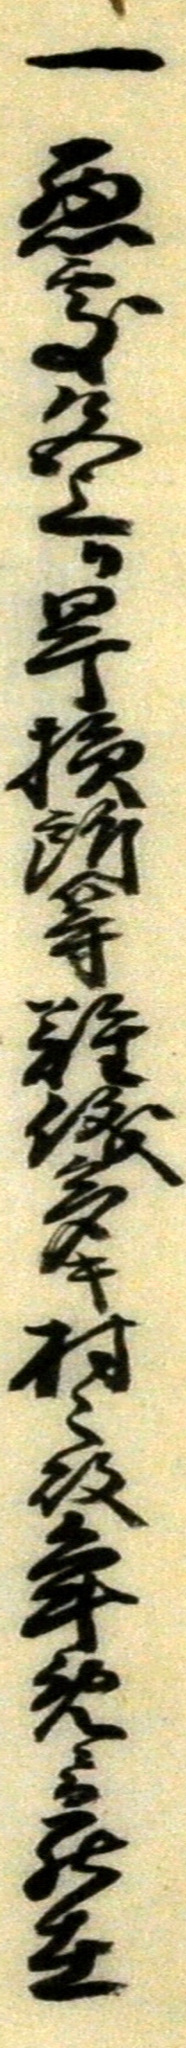一悪處色上り旱損所等難儀多キ村々故年免ニ而罷在
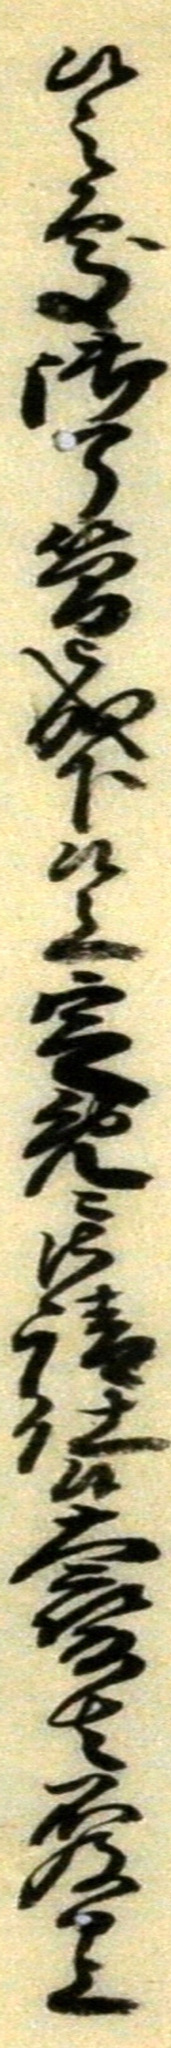候之處御了簡被成下候上定免ニ御請仕候大変者不及申上
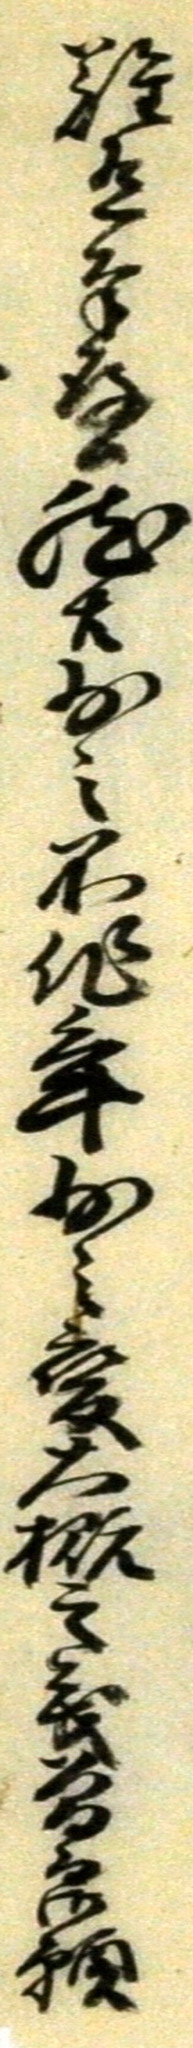難有奉存候然共少之不作年少之変大概之義曽而御願
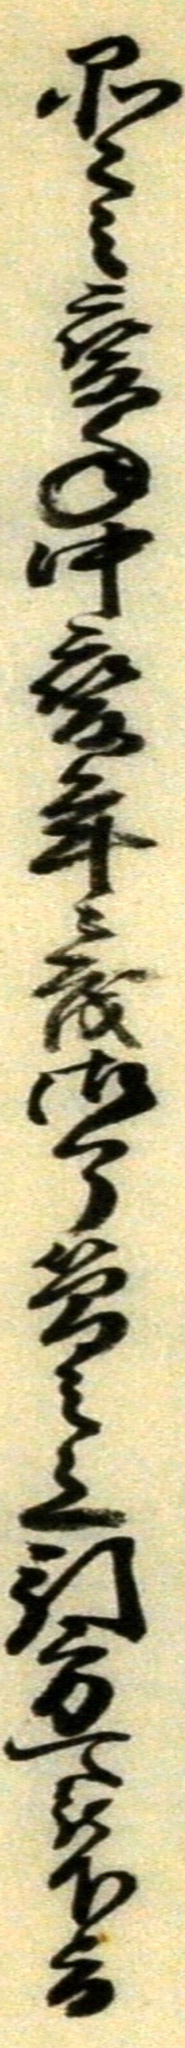品々之変年中変年ニ茂御了簡之上引方可被下旨
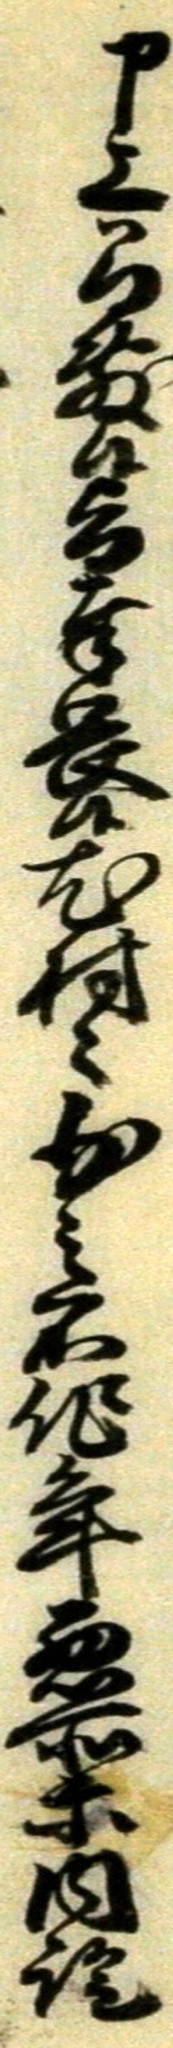申上間敷候旨奉畏候尤村々少之不作年悪所等内証
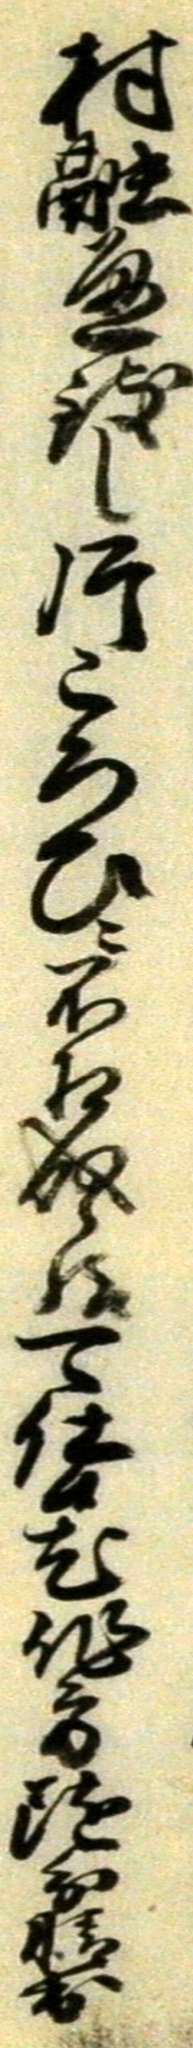村融通致し方片ころひニ不相成候様可仕候尤作方随分情出
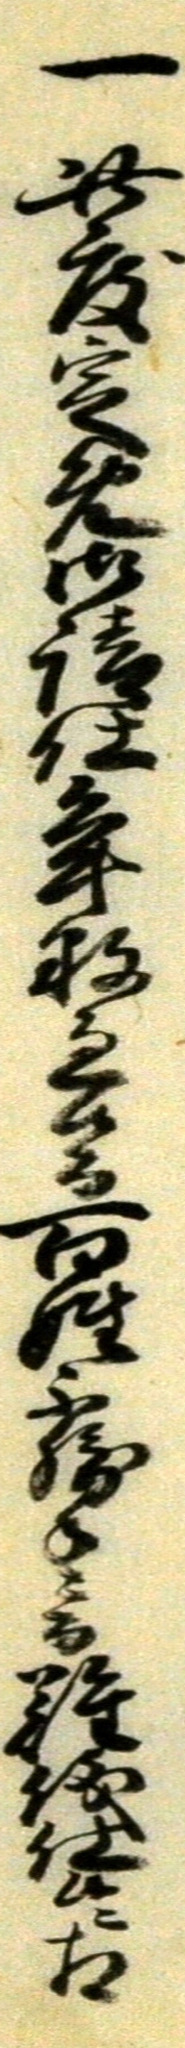一此度定免御請仕年数過候而百姓不勝手ニ而難儀仕候ニ相
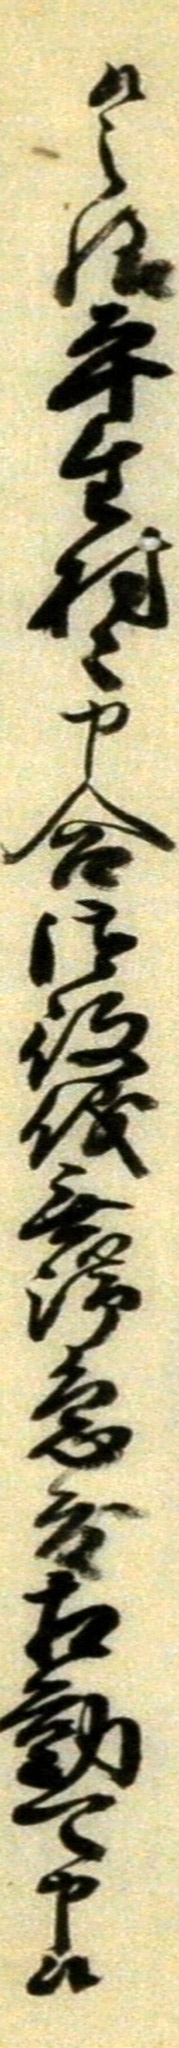候之様平生村々申合御役儀無滞急度相勤可申候
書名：留書
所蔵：伊那市立高遠町図書館・合同会社AMANE
